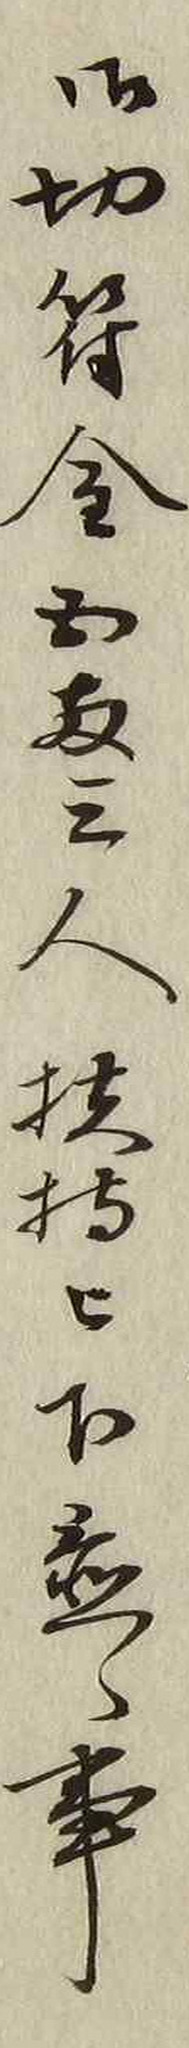御切符金五両三人扶持下し置かれ候事
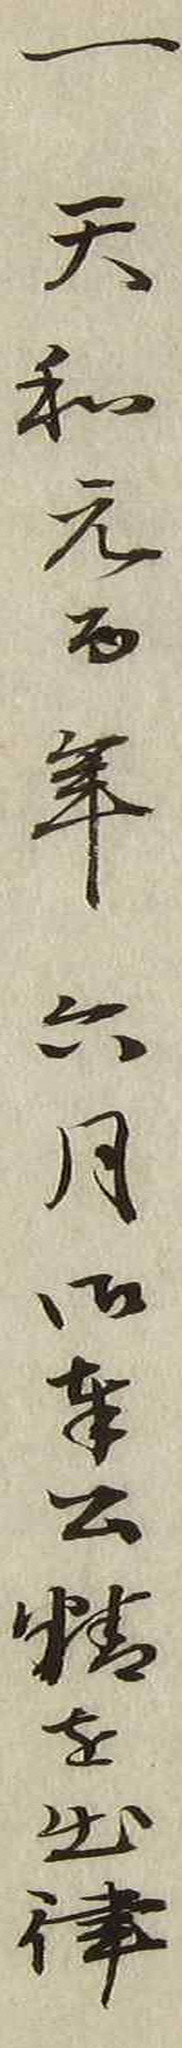一天和元酉年六月御奉公精を出律
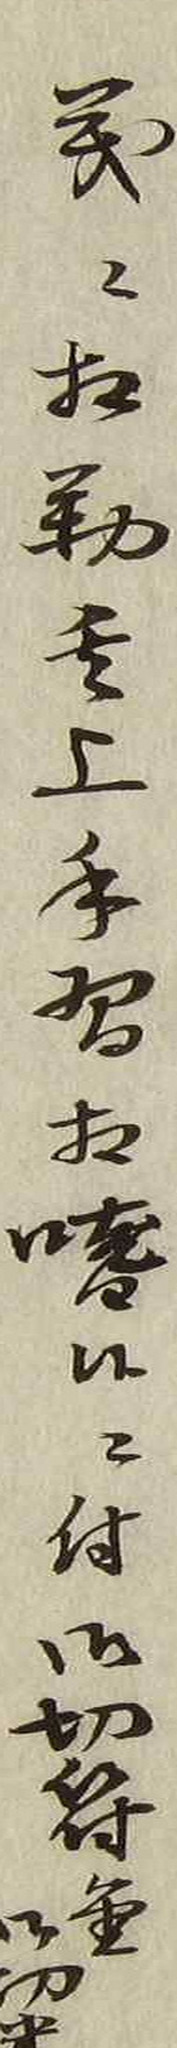義ニ相勤其手習相嗜み候ニ付き御切符金御切り米
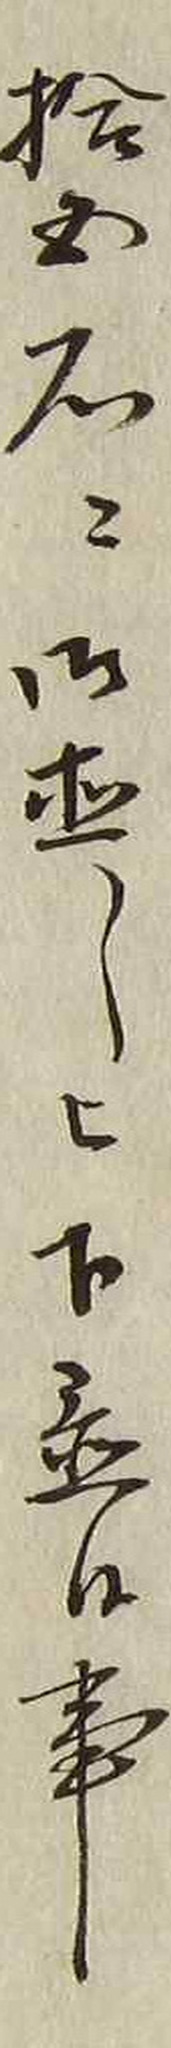拾五石ニ御直し下し置かれ候事
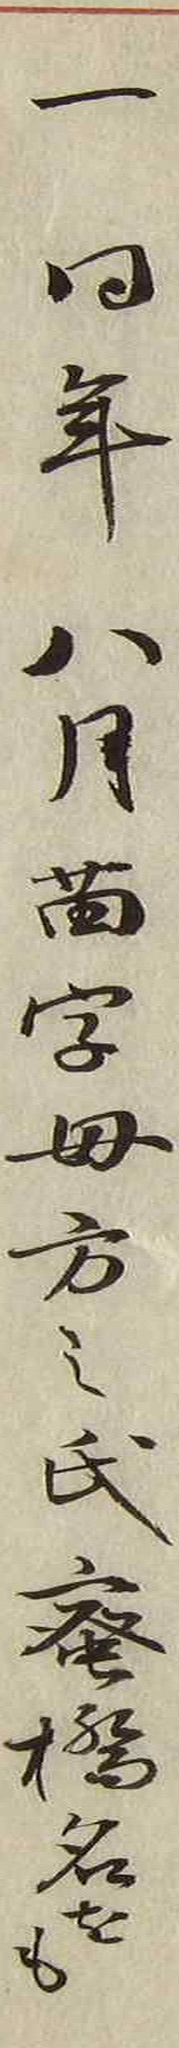一同年八月苗字母方之氏密橋名をも

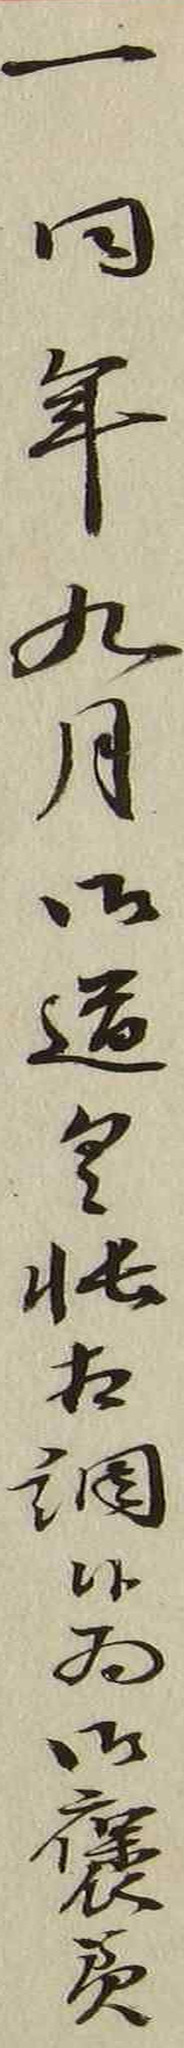一同年九月御道具帳相調べ候御褒美
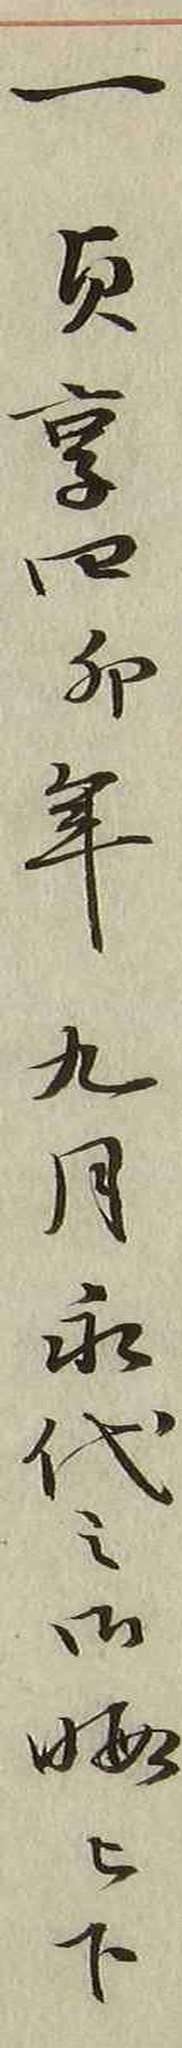一貞享四卯年九月永代之御暇下され
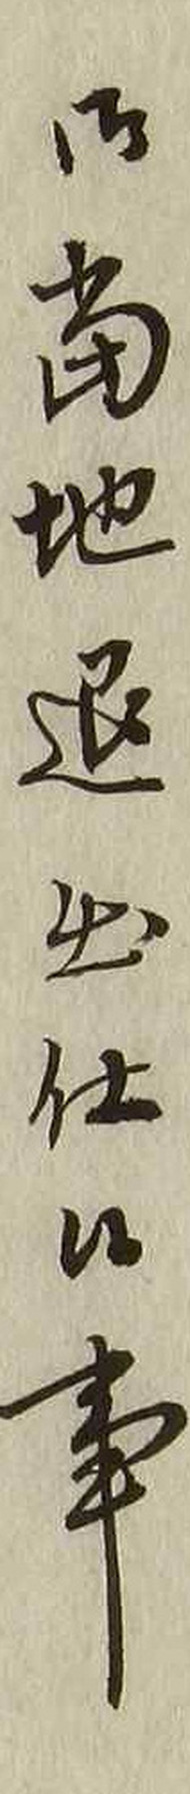御当地退出仕り候事
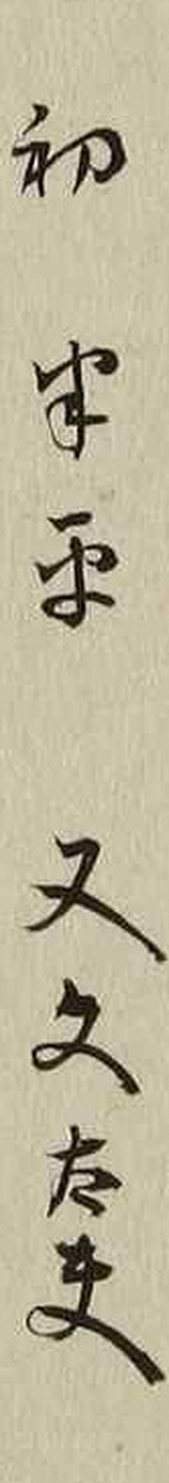初半平又文太夫
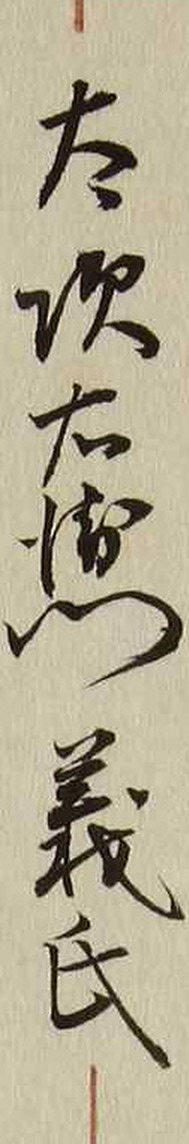太次右衛門義氏
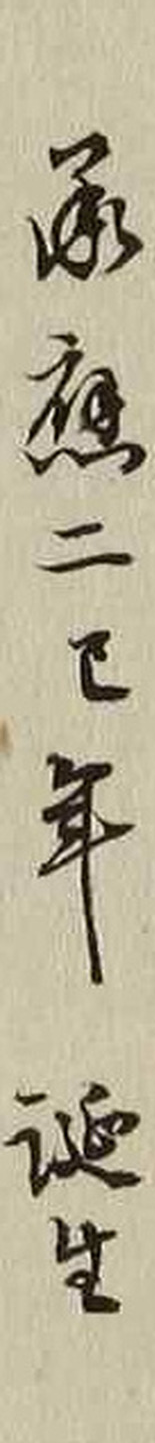承応二巳年誕生
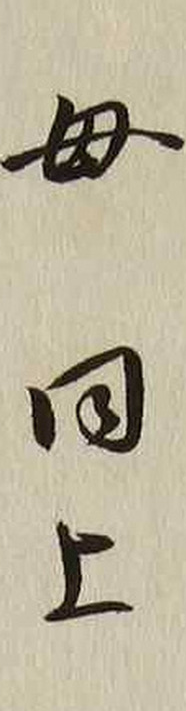母同上
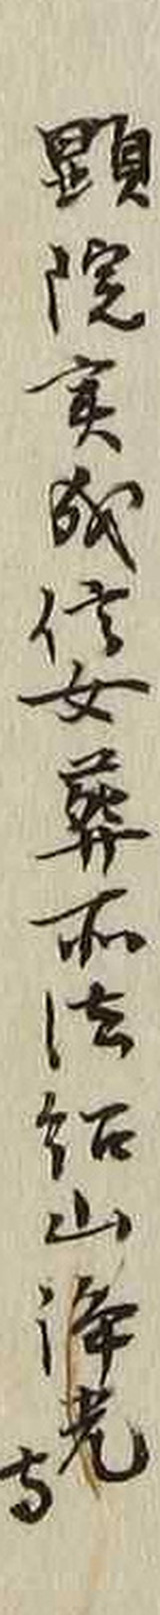顕院実成信女葬所法紹山し浄光寺
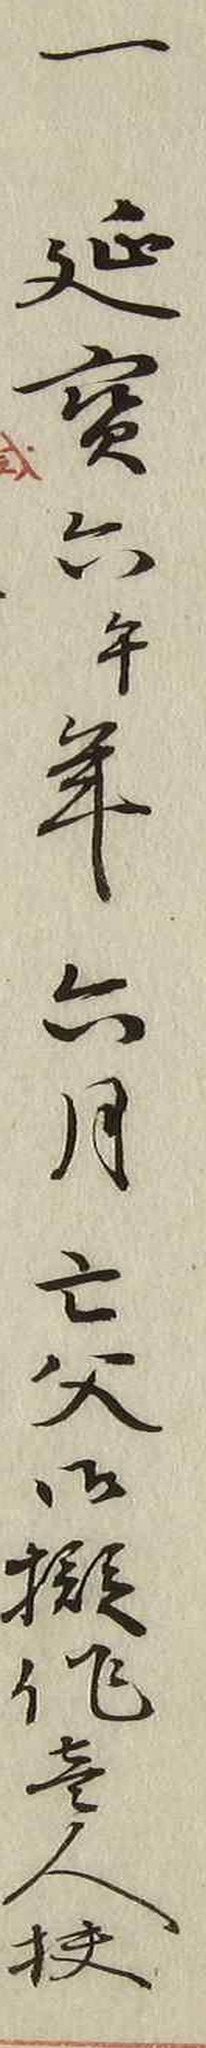一延宝六午年六月亡父御擬作壱人扶
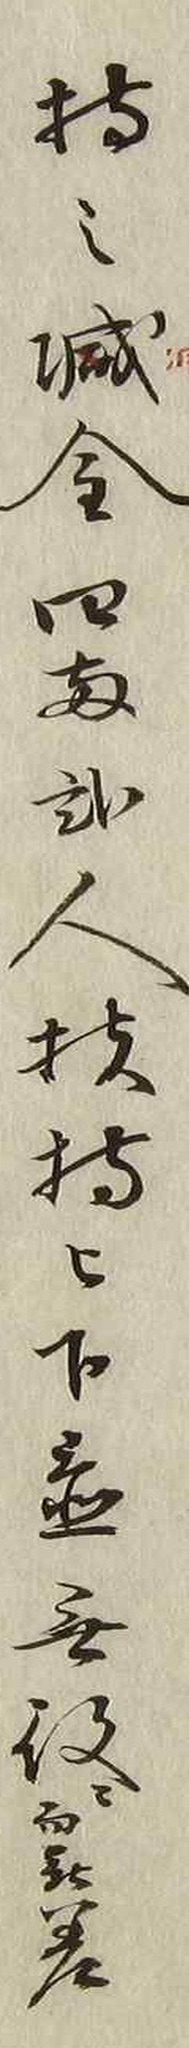持之減金四両弐人扶持下し置かれ無役二て差し
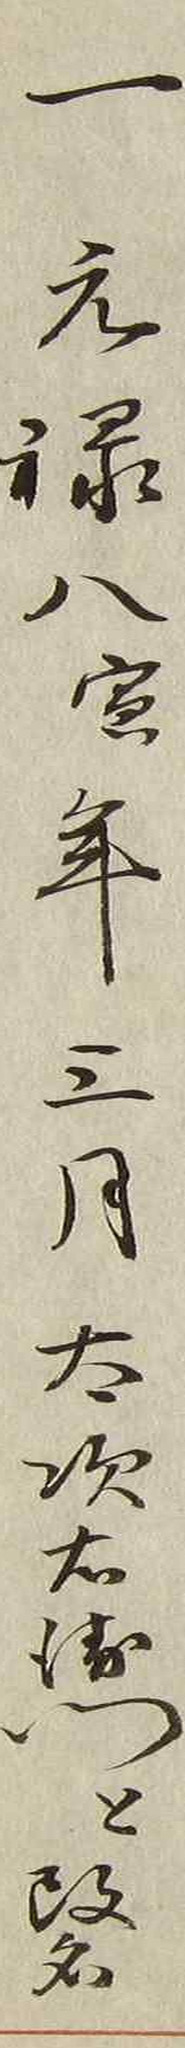一元禄八寅年三月太次右衛門と改名
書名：諸士系譜　巻之16　い之部16
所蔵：会津若松市立会津図書館
